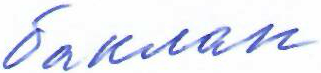баклан
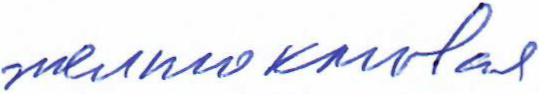желто клювая
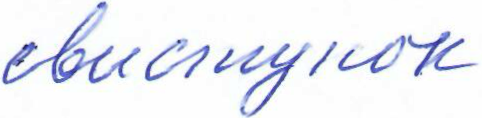свистунок
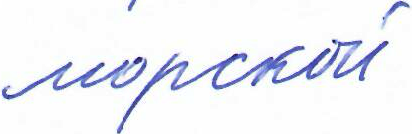морской
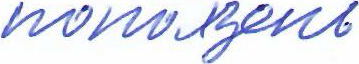поползень
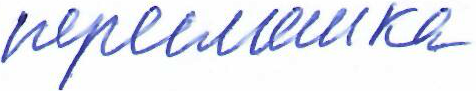пересмешка
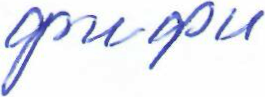фифи
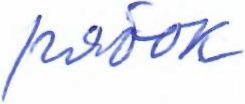рябок
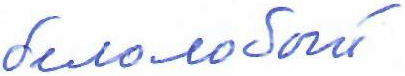белолобый
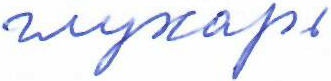глухарь
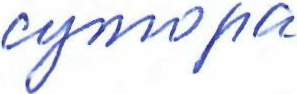сутора
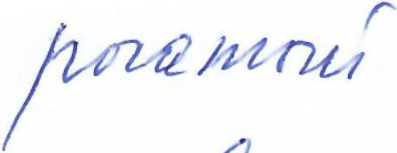рогатый
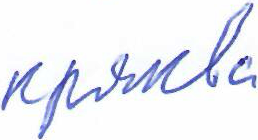кряква
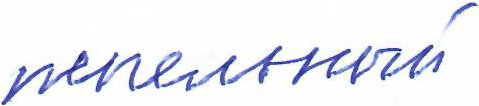пепельный
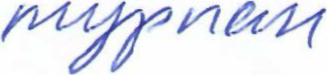турпан
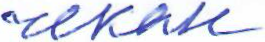чекан
